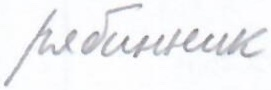рябинник
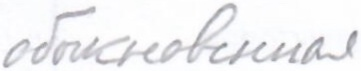обыкновенная
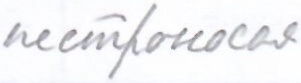пестроносая
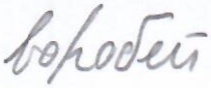воробей
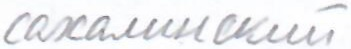сахалинский
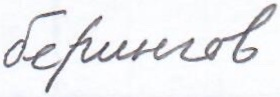берингов
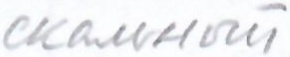скальный
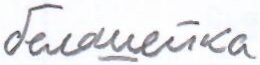белошейка
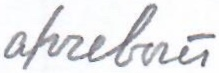арчевый
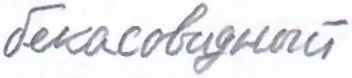бекасовидный
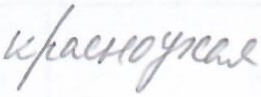красноухая
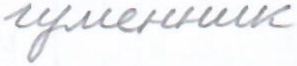гуменник
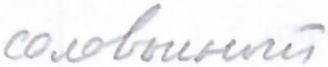соловьиный
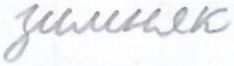зимняк
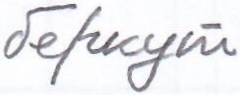беркут
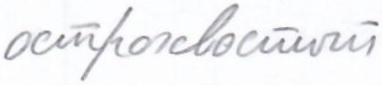острохвостый
